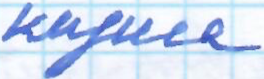клуша
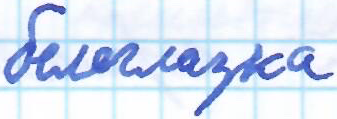белоглазка
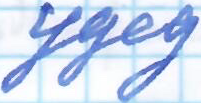удод
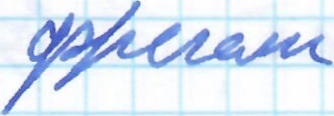фрегат
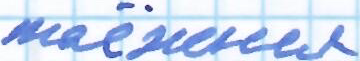таёжная
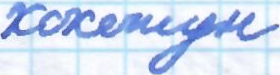хохотун
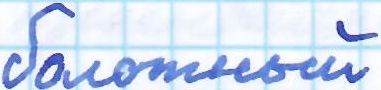болотный
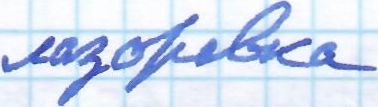лазоревка
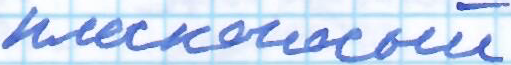плосконосый
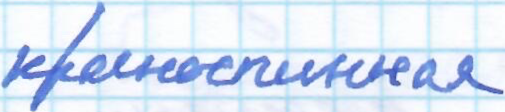красноспинная
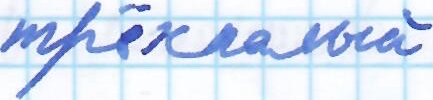трёхпалый
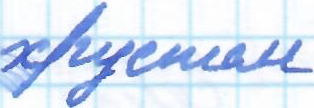хрустан
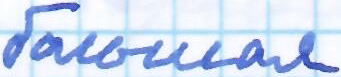большая
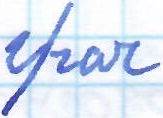грач
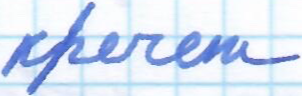кречет
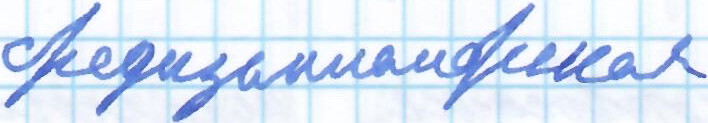средиземноморская
